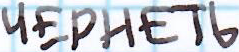чернеть
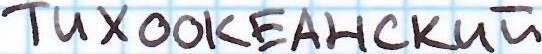тихоокеанский
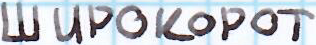широкорот
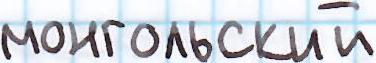монгольский
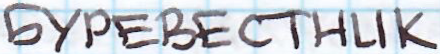буревестник
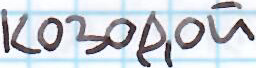козодой
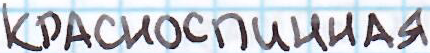красноспинная
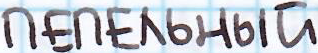пепельный
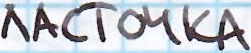ласточка
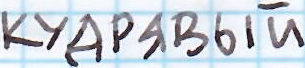кудрявый
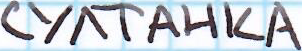султанка
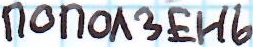поползень
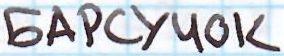барсучок
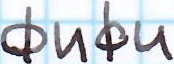фифи
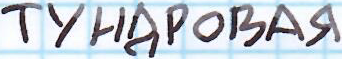тундровая
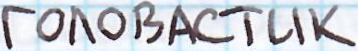головастик
